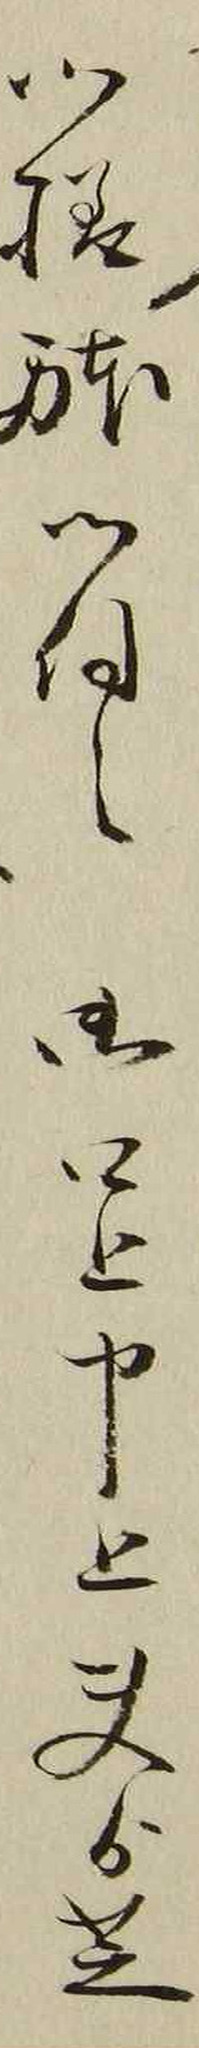御様体御伺之御口上申上夫ゟ芝
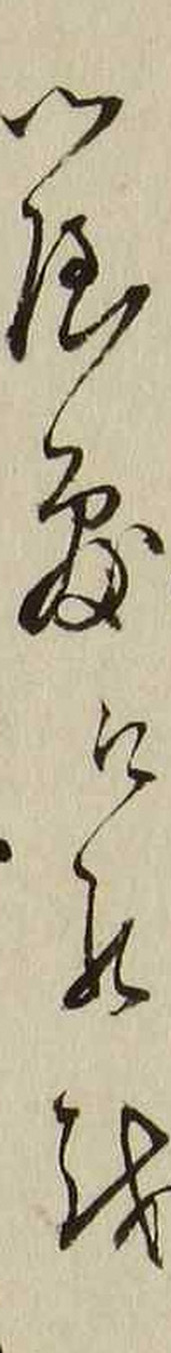御屋敷江罷越
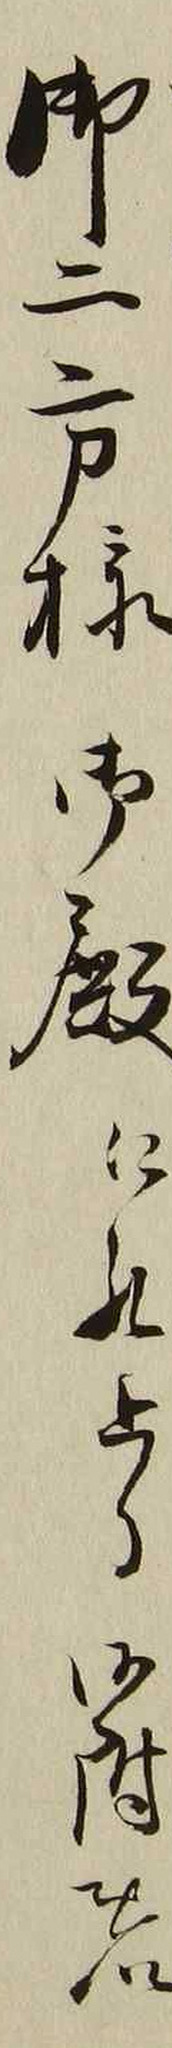御二方様御殿へ罷上り御附を以
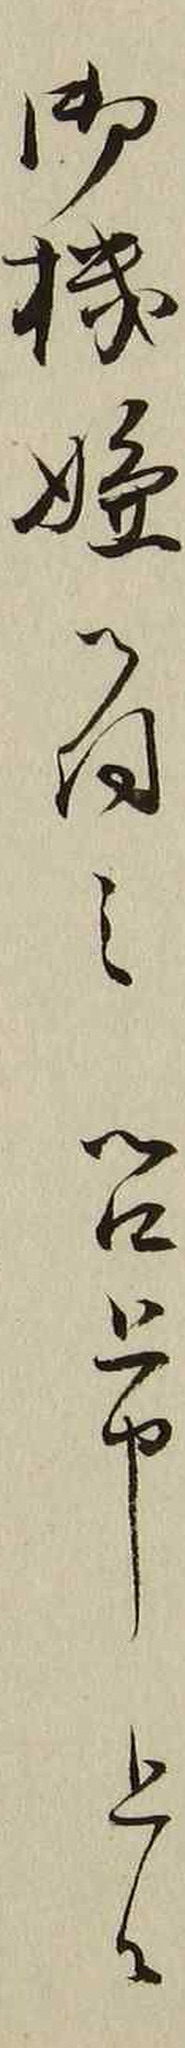御機嫌伺之御口上申上候
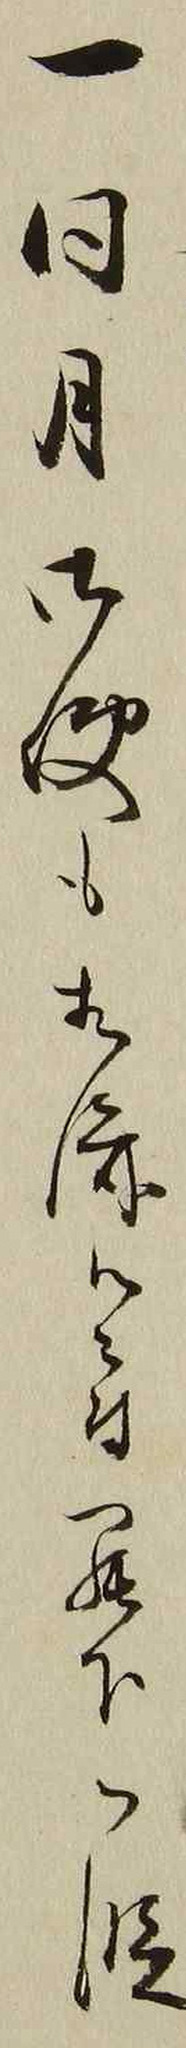一同月御使も相済候に付罷下候段
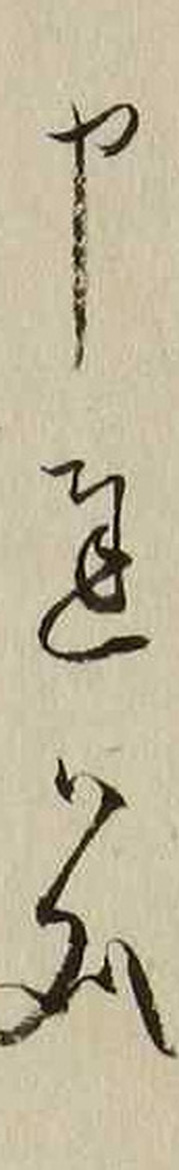申達候処
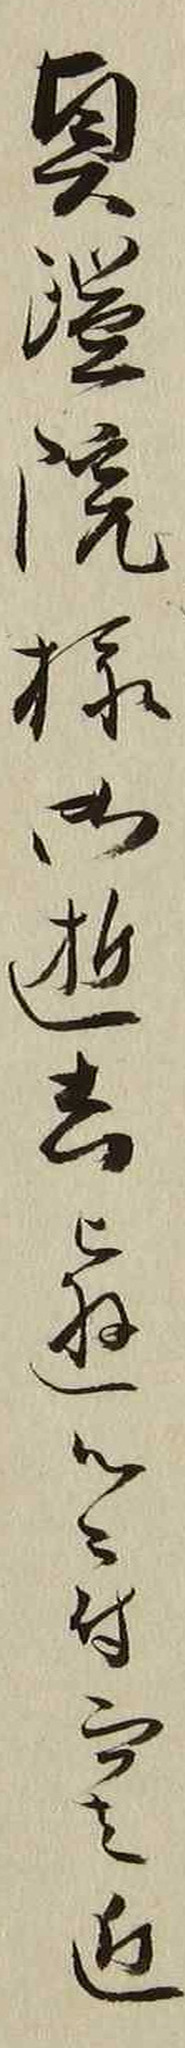貞鑑院様御逝去被遊候に付而は近
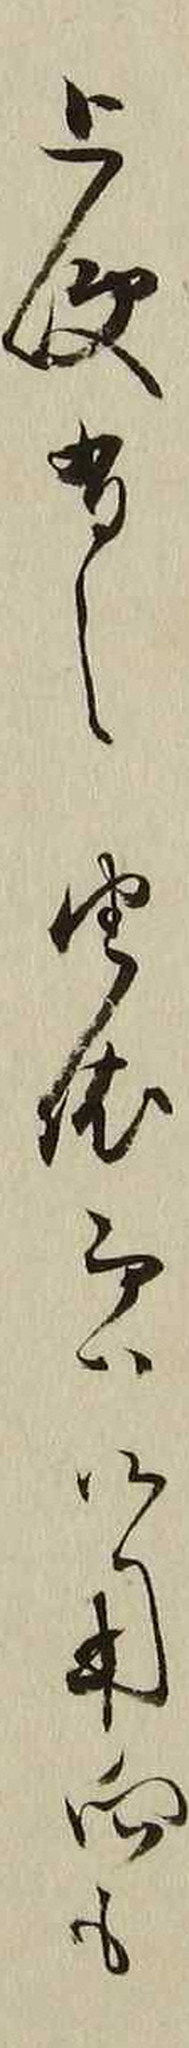々上使有之由依而は御用向も
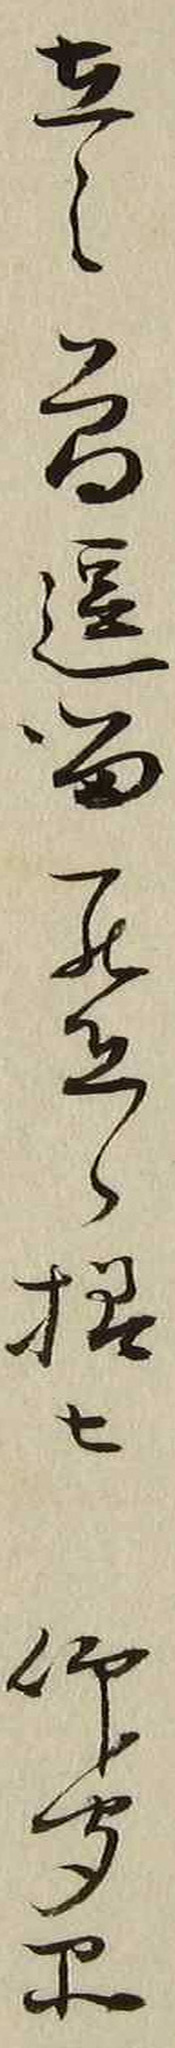在之候間逗留罷在候様被仰聞品
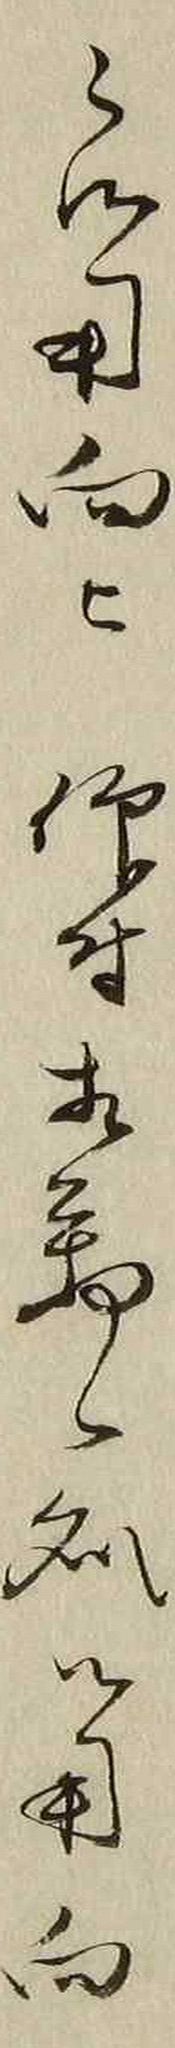々御用向被仰付相勤候処御用向
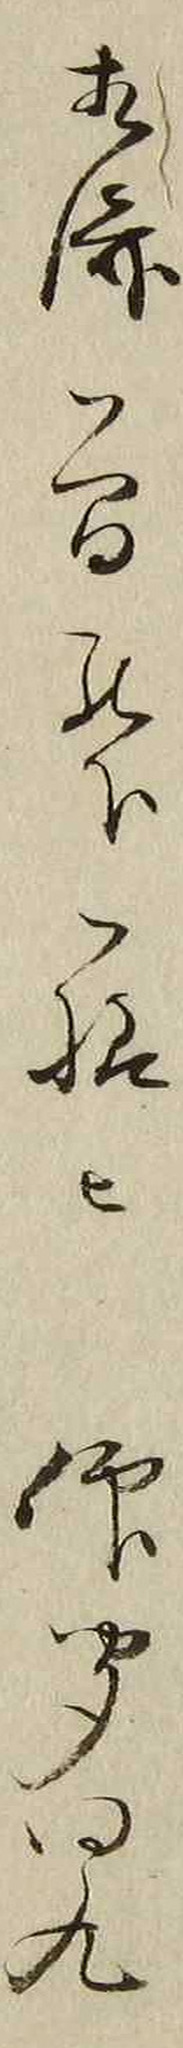相済候間罷下候様被仰聞同九
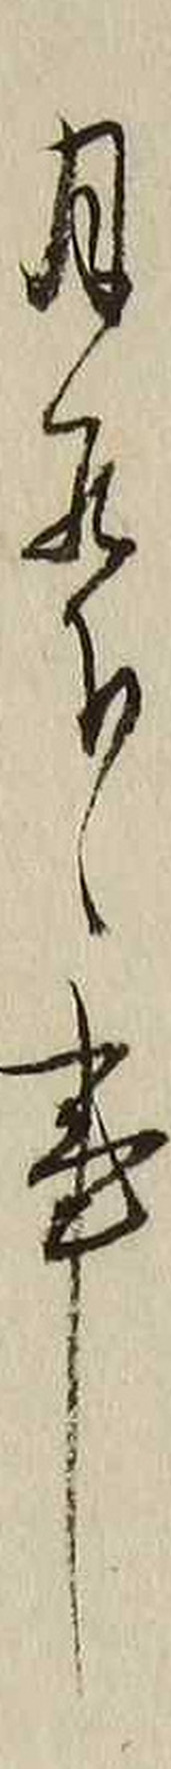月罷下候事
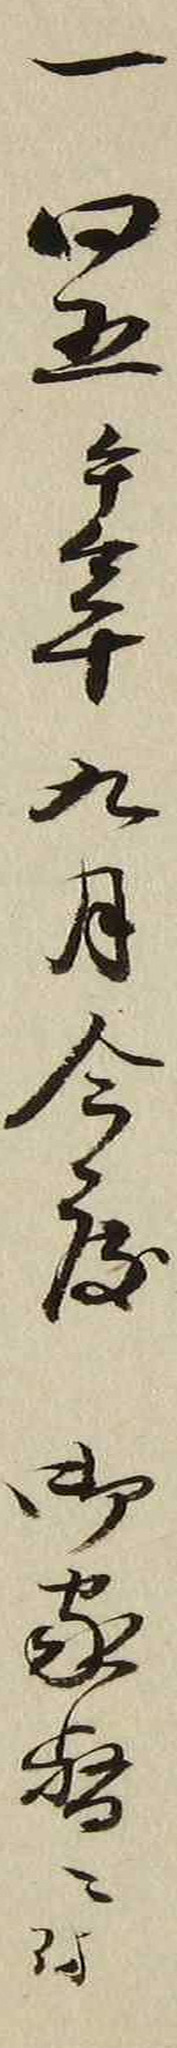一同五午年九月今度御家督に付
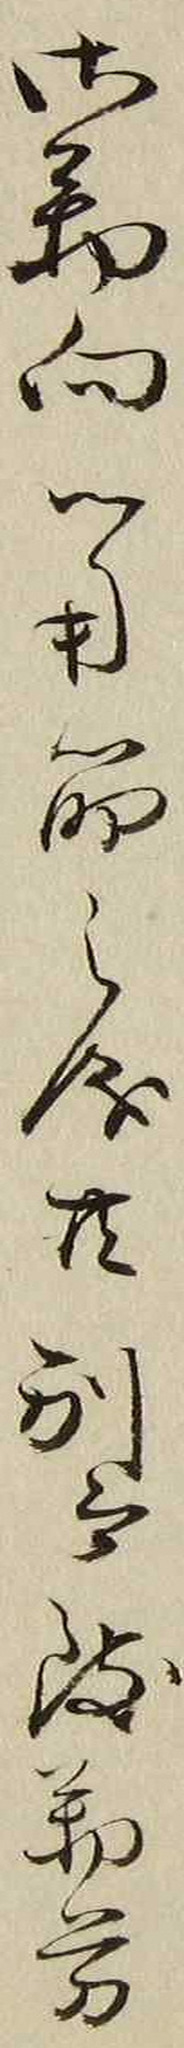御勤向御用筋之儀共別而致勤労
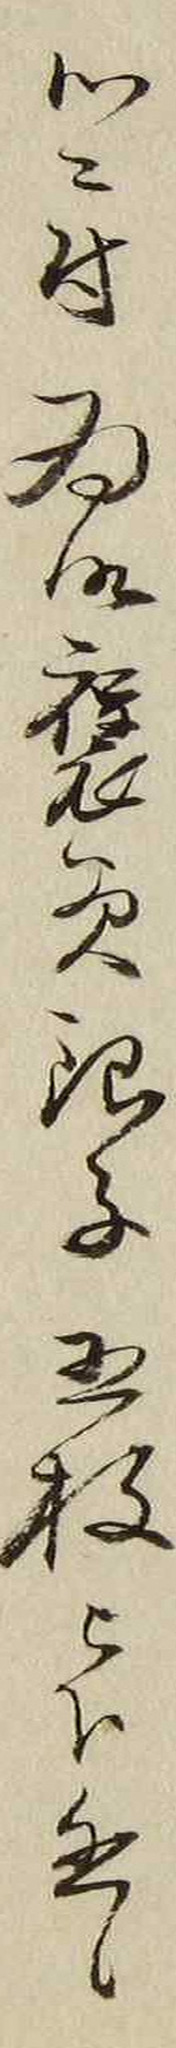候に付為御褒美銀子五枚被下置候
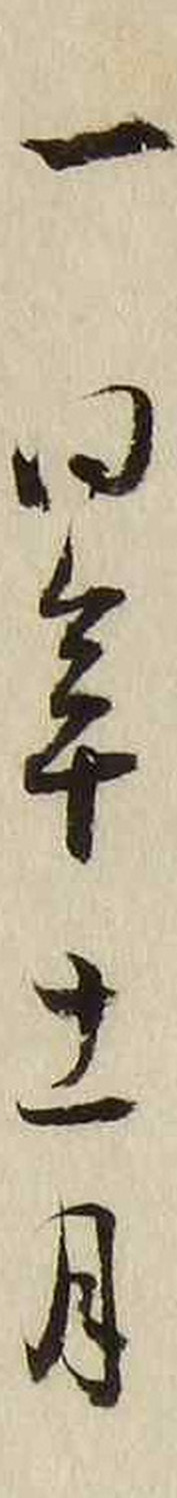一同年十一月
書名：諸士系譜　巻之292　き之部1
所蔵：会津若松市立会津図書館
